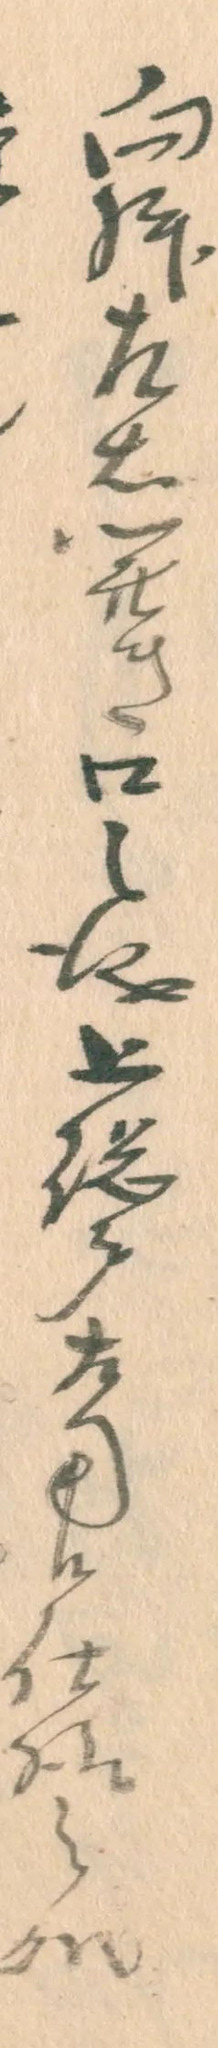一向拝左右開き口之儀上総戸左用候仕様之処
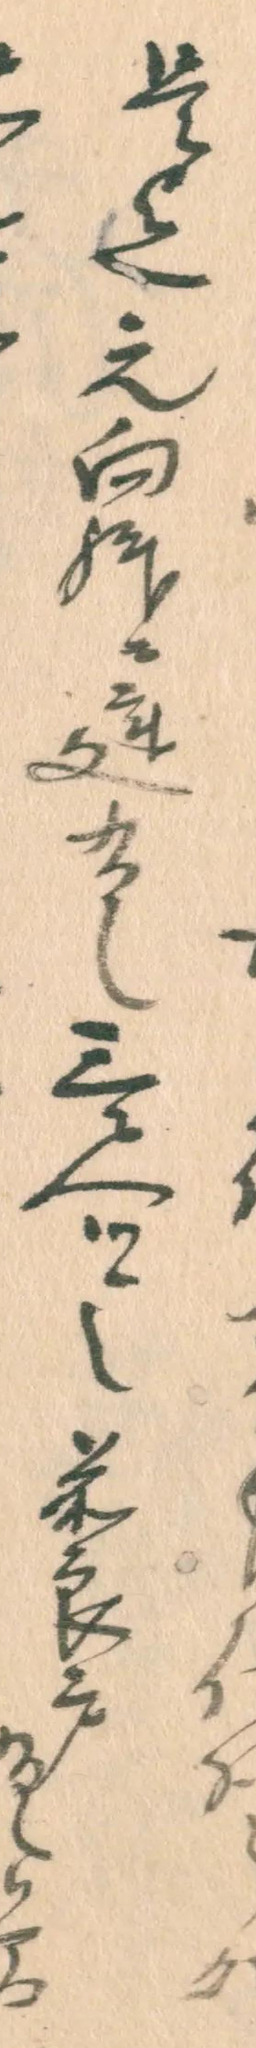是迄元向拝ニ建有候三尺ツヽ之前良戸有之候間
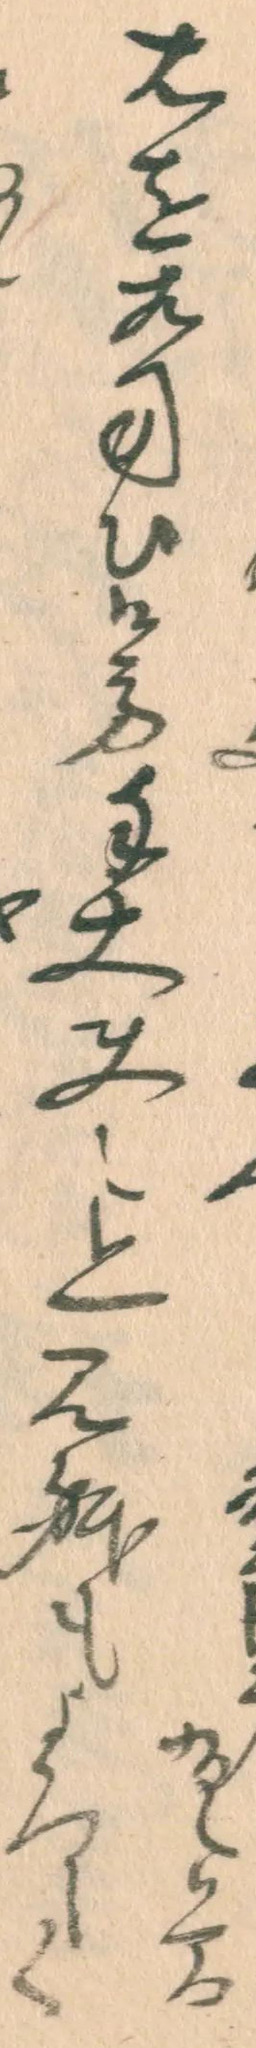右を相用ひ候方手丈夫之上見体もよろしく
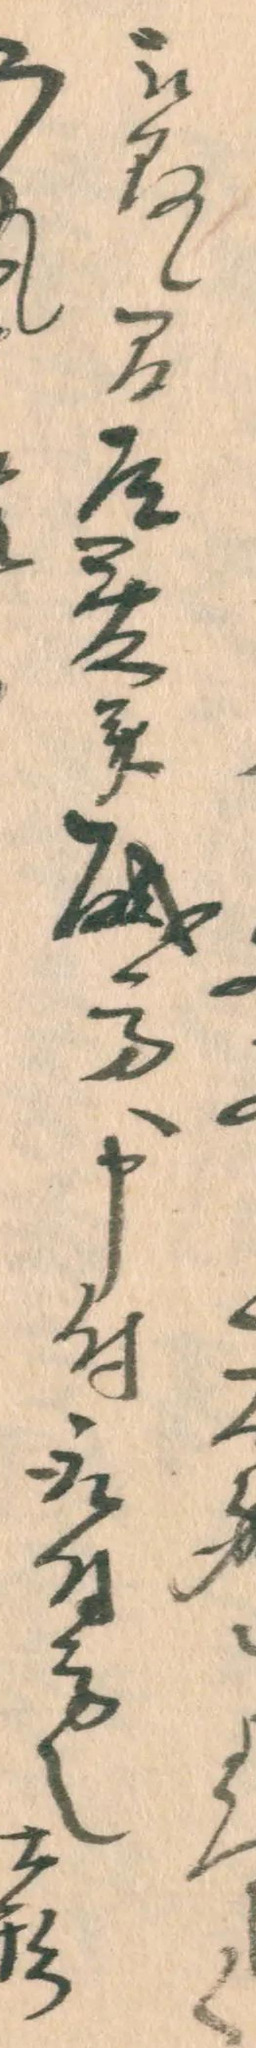被存候間屋敷幷職方へ申付取付方之仕形
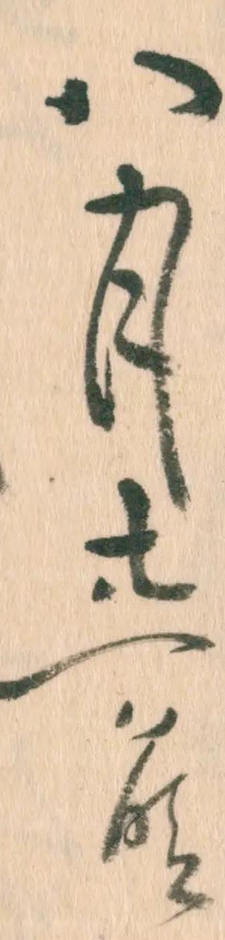八月廿一日晴
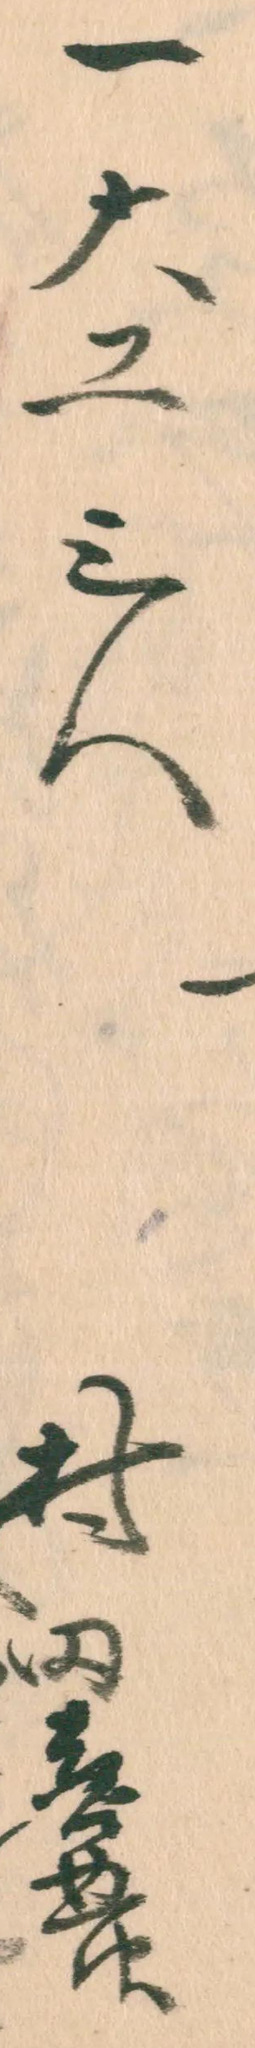一大工三人村田喜惣次
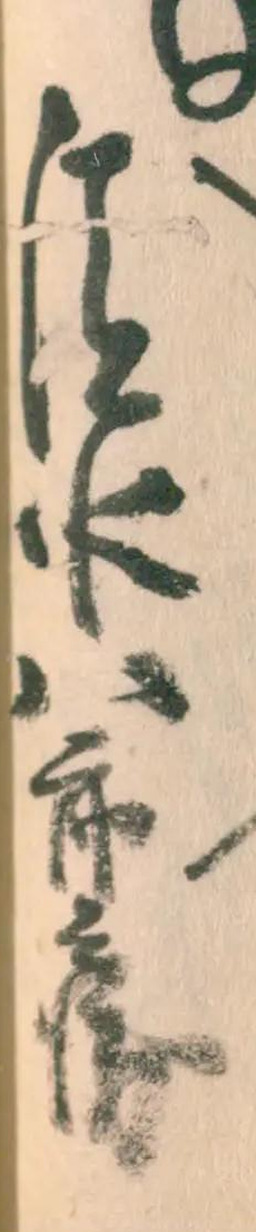清水八郎兵衛
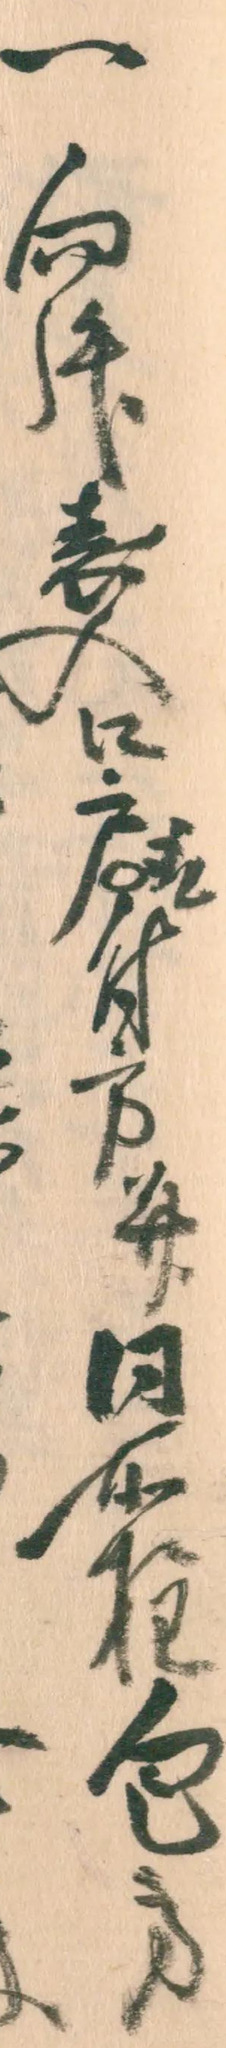一向拝表入口戸取付方幷同所下柱包方
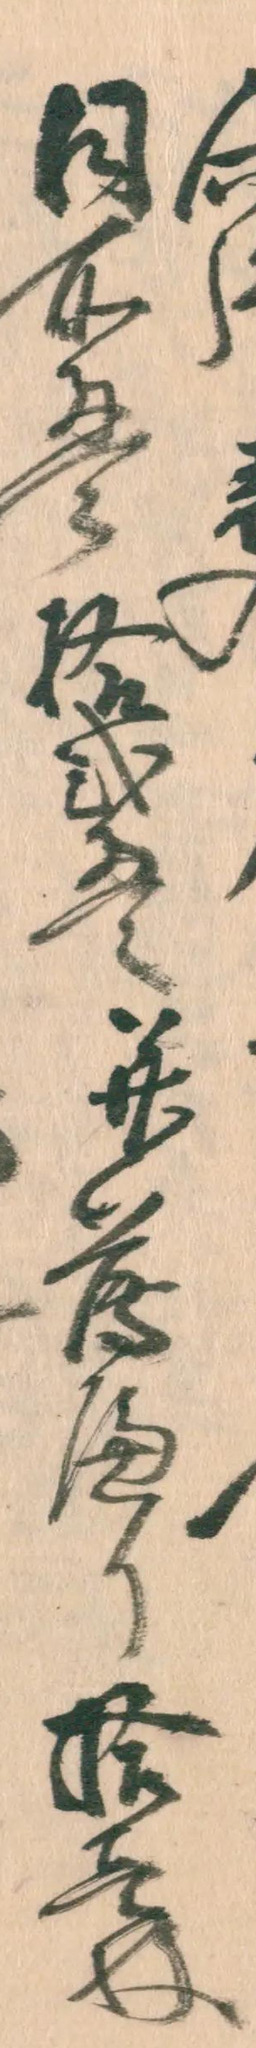同所畳拾弐畳幷薄へり拾壱枚
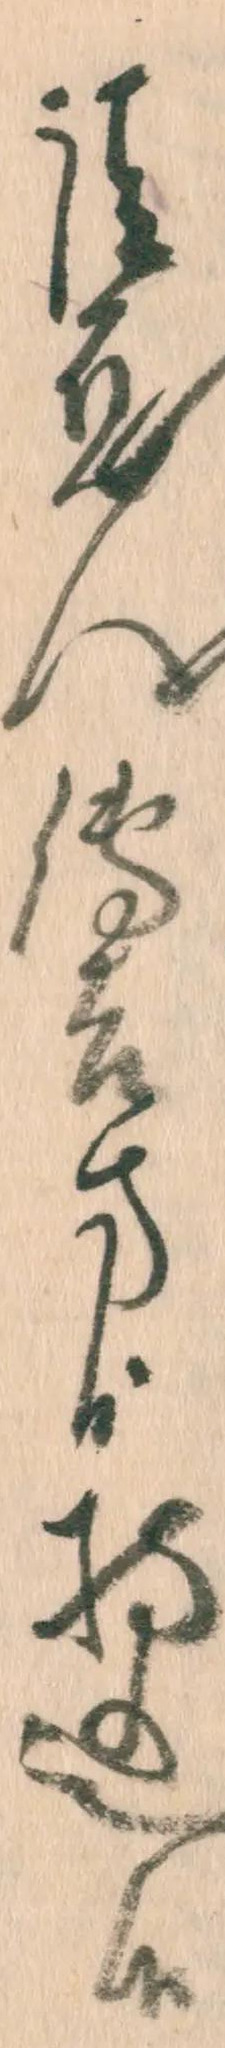請負人伝吉方ゟ持込候
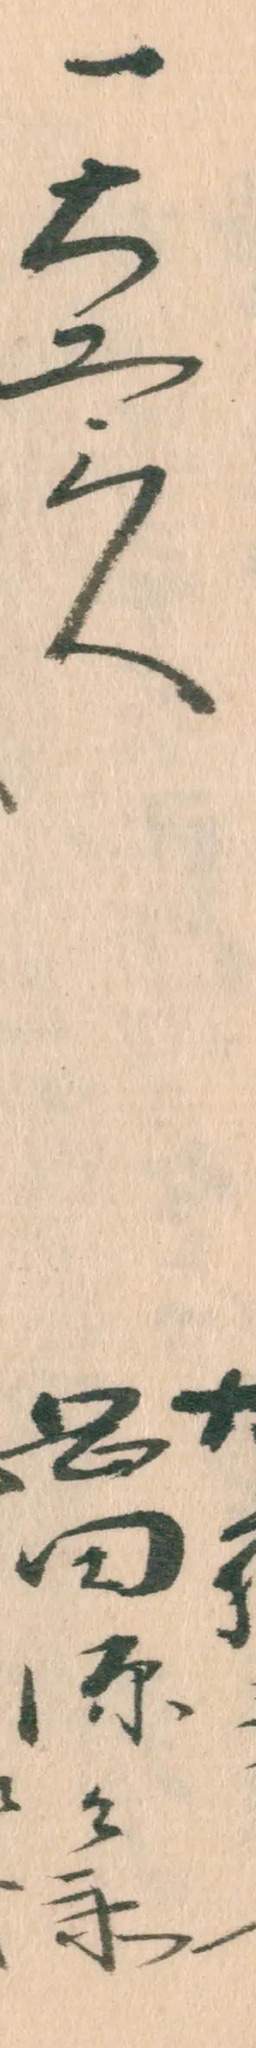一大工三人岡田源兵衛
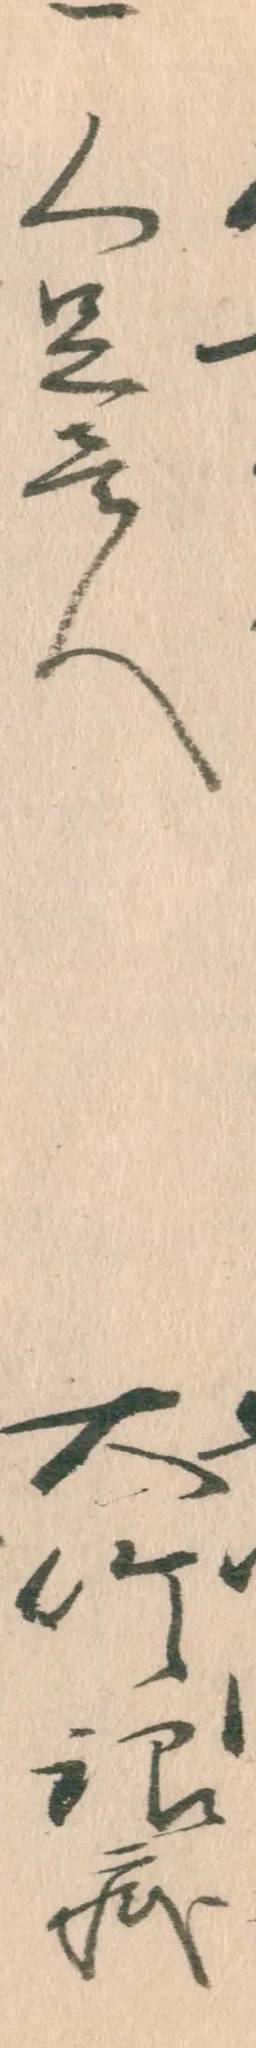一人足壱人大竹銀蔵
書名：三十三間堂. [2]
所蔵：国立国会図書館 National Diet Library, JAPAN
